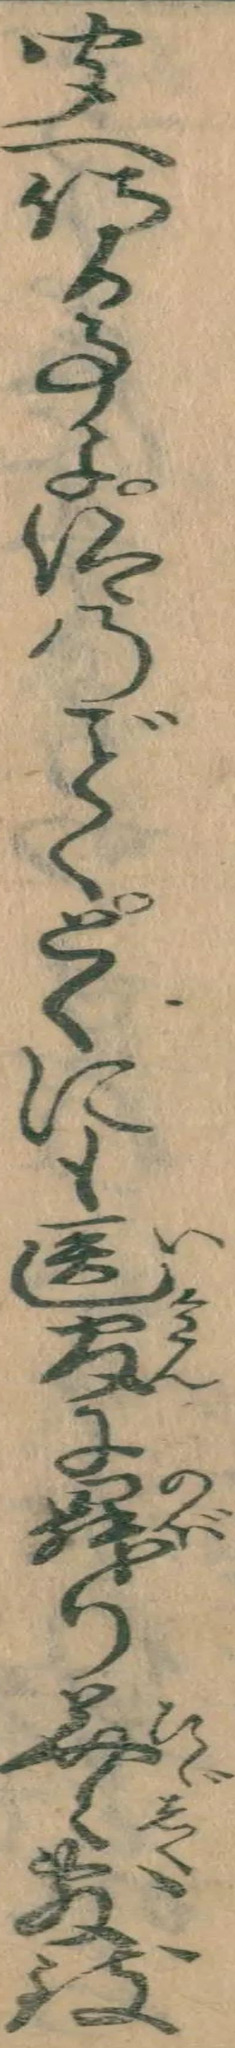聞へ侍る事よ。仰のごとく。とくにも医官に昇り美々敷致
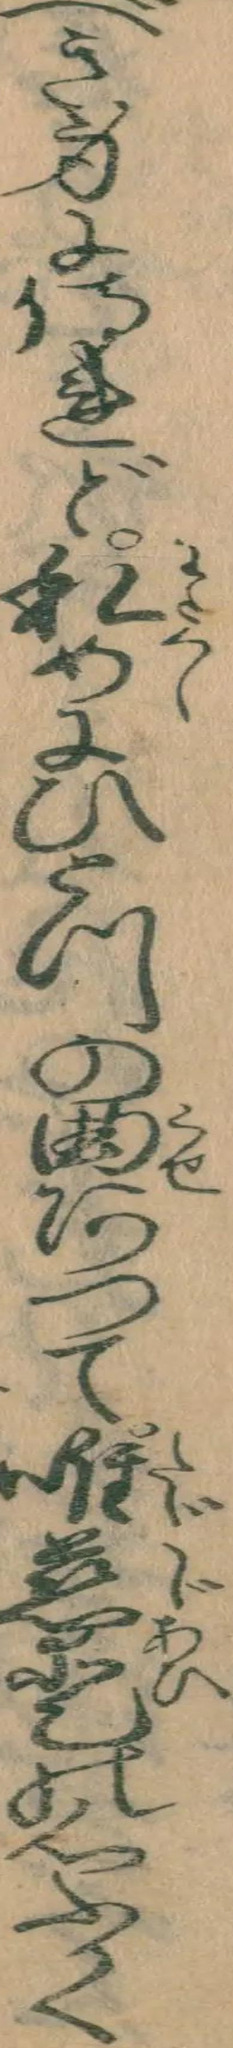べき身に侍れど。私めにひとつの曲あつて。唯慈愛の心ふかく
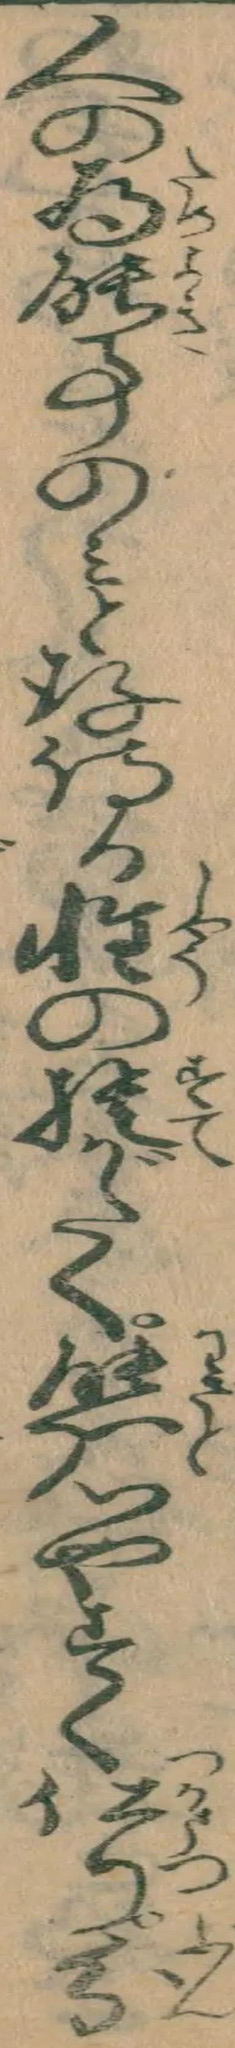人の為能事のみと存侍る性の捨がたく。態心やすく仕り。分
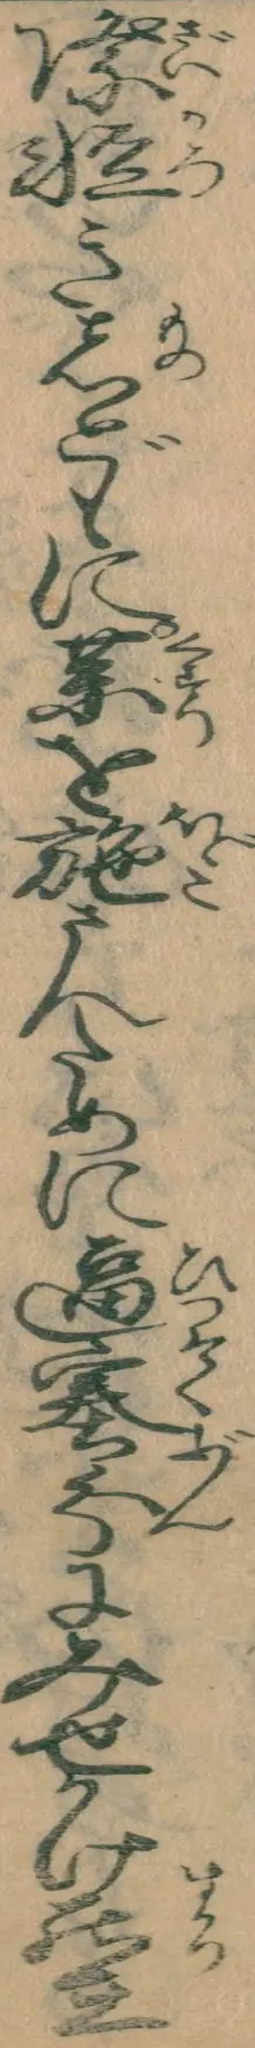際軽き者どもに薬を施さんために逼塞分にみせかけ罷在
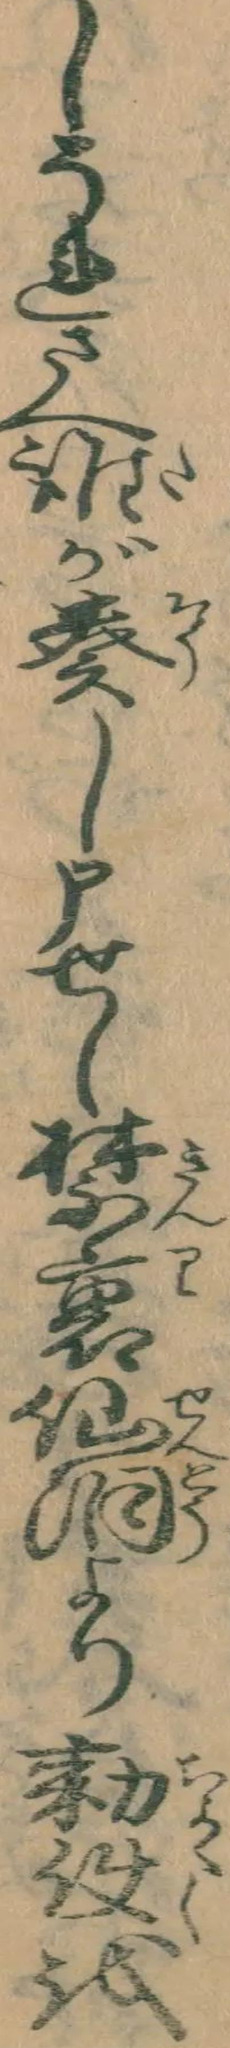しそれさへ誰が奏し申せし禁裏仙洞より勅使を
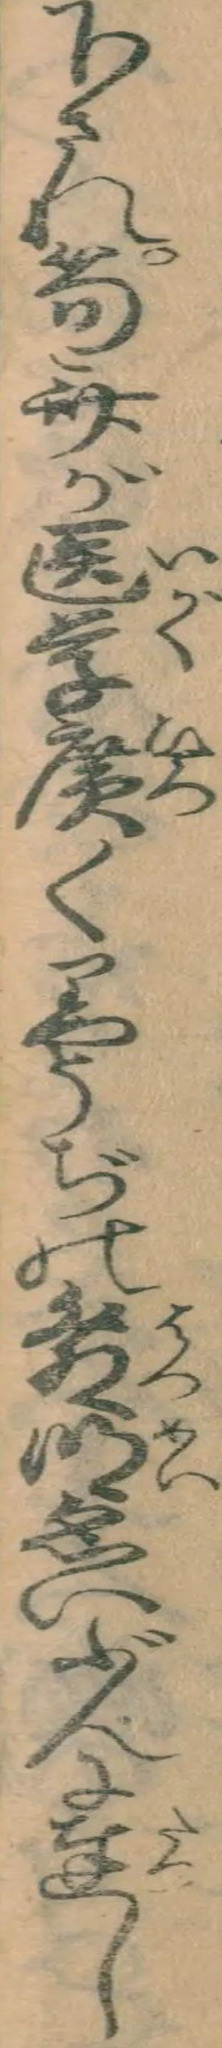下され。筍斎が医学広くりやうぢの発明ゑいぶんに達し

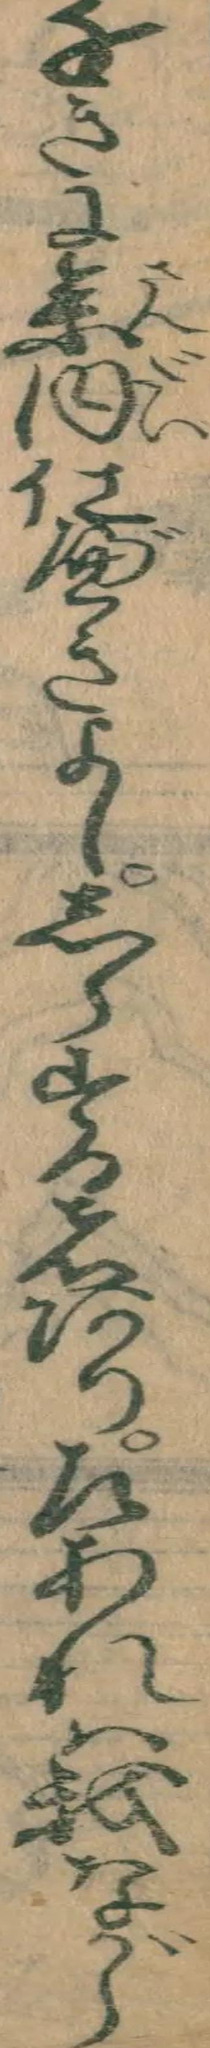近きに参内仕べきよし。しらする者あり。左あれは我ながら
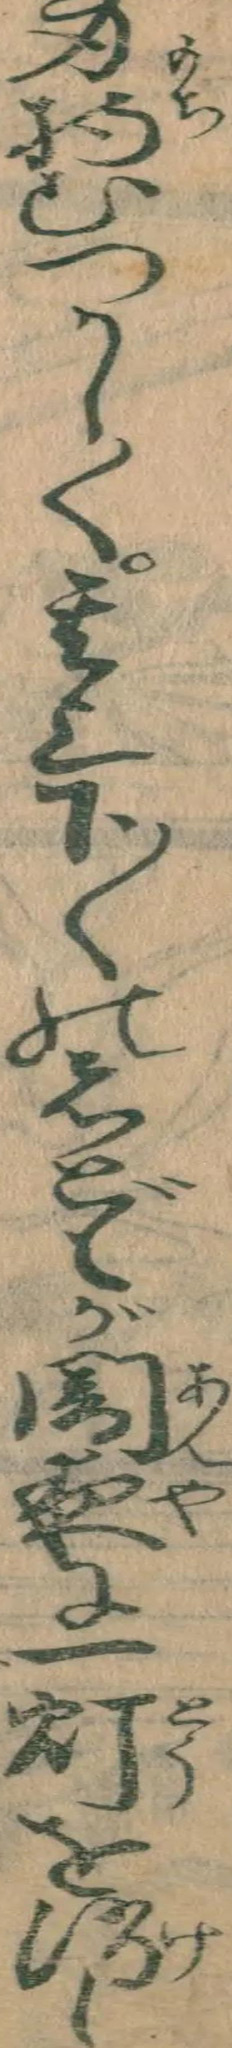身持むつかし〱。其上下々の者どもが闇夜に一灯を消し
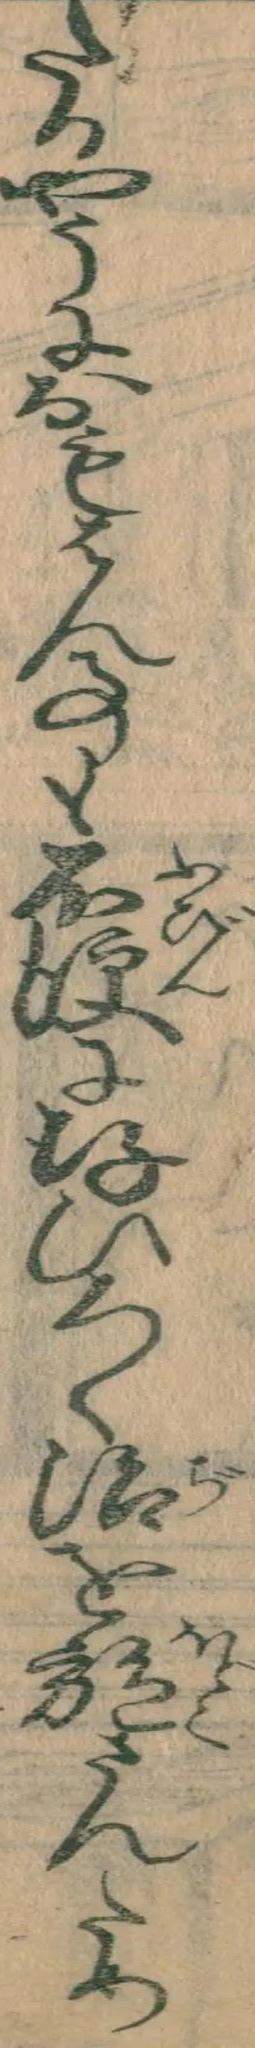たるやうにおもはん事も不便に存ひろく治を施さんため
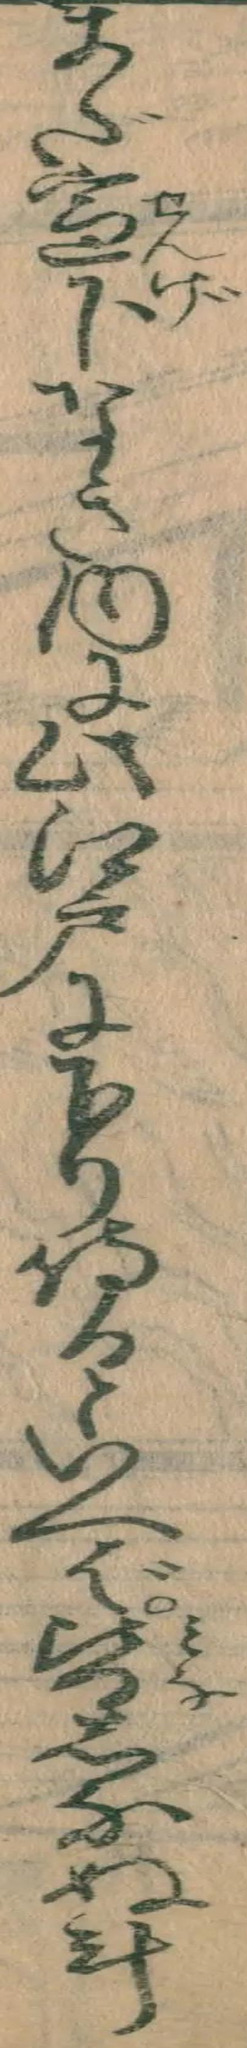まだ宣下なき内に此江戸に下り侍るといへば。皆しなぬ計
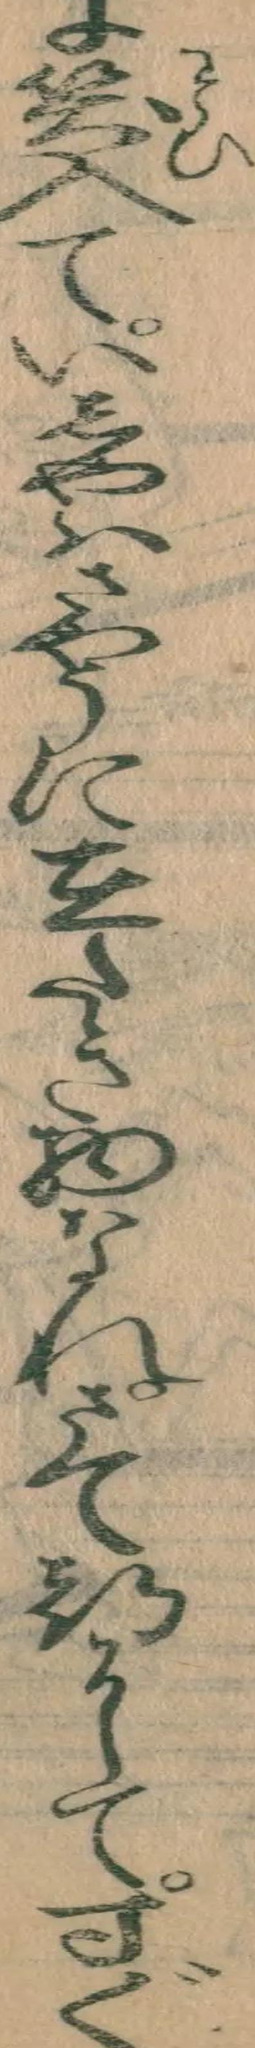に笑入て。いしやはさやうに在たき物なれ。さて都にて。す〲
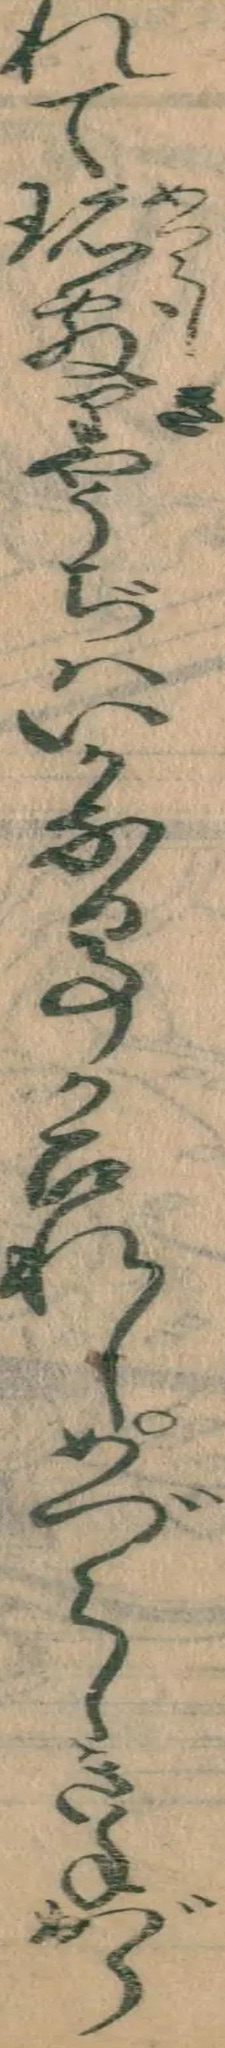れて珍敷りやうぢはいかなる事か召れし。めづらしき手がら
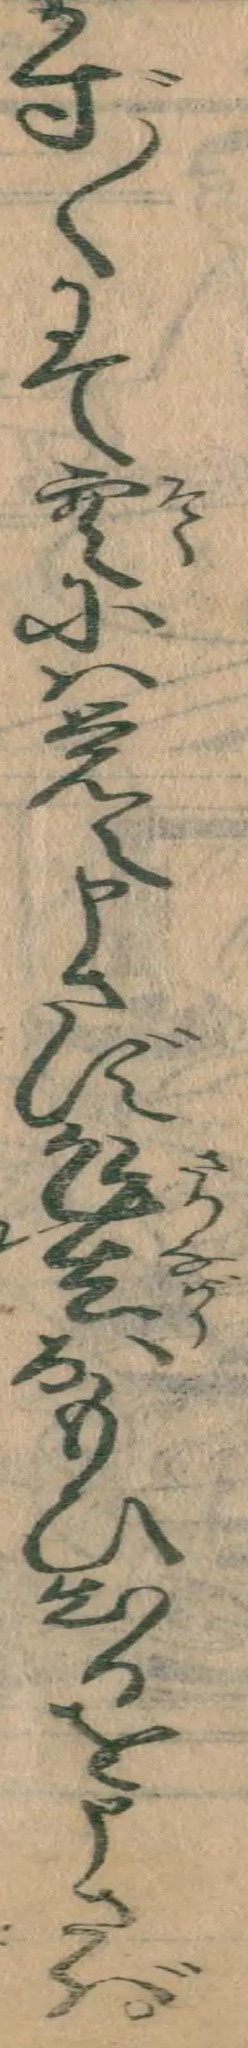かず〳〵にて空には覚え申さず乍去おもひ出るを申さば。
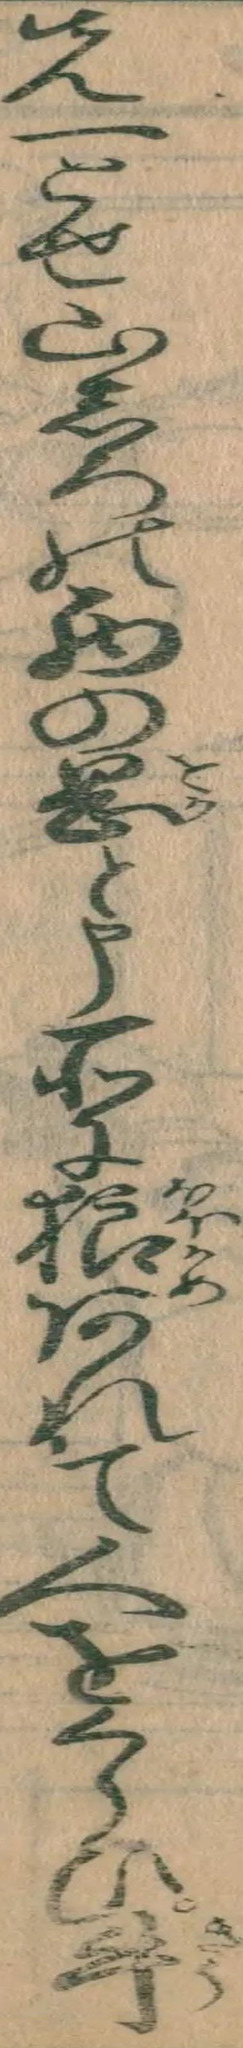先一とせ山しろの西の岡と申所に狼あれて人をくらひ。牛
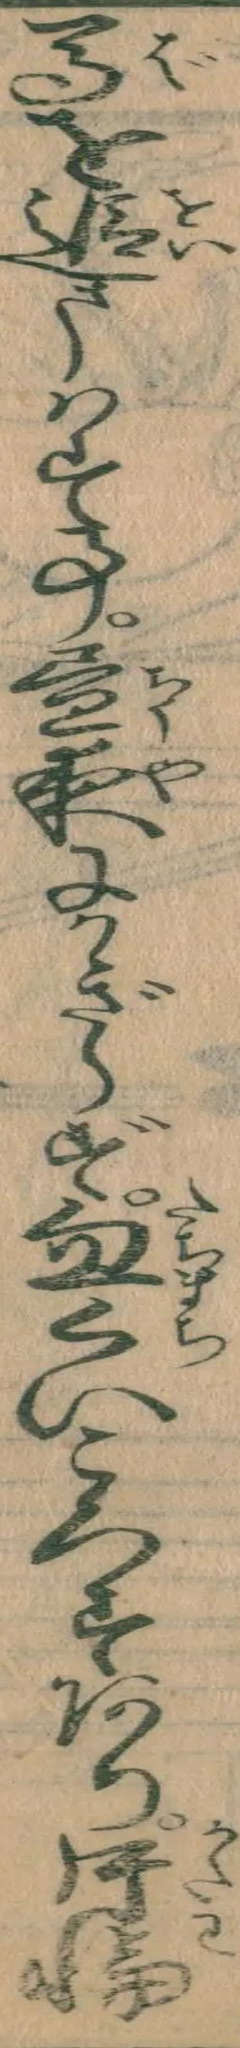馬を追まはす事。昼夜にかぎらず。忽くいころすあり。片輪
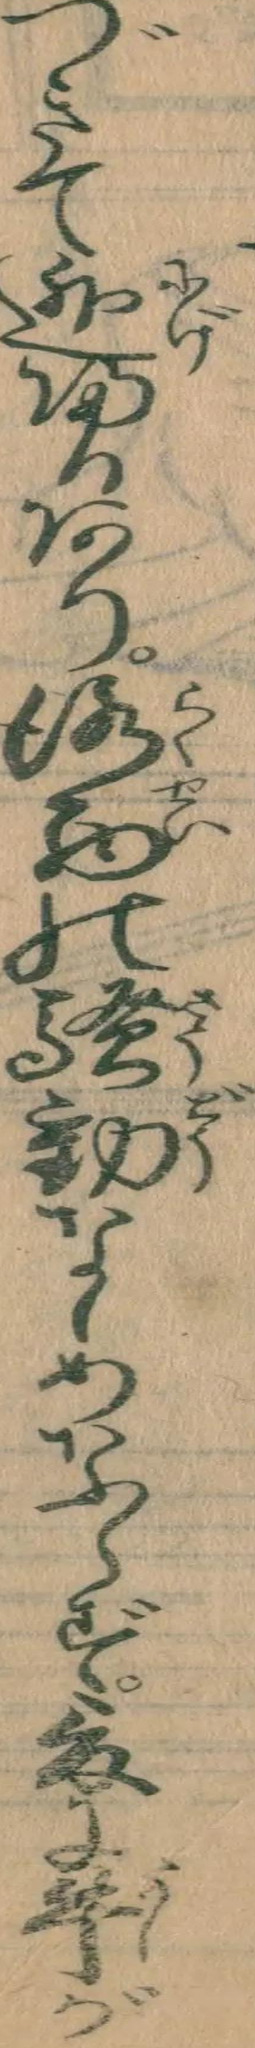づきて逃帰るあり。洛西の騒動なゝめならず。爰に牛が
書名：新竹斎 5巻
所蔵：国立国会図書館 National Diet Library, JAPAN
